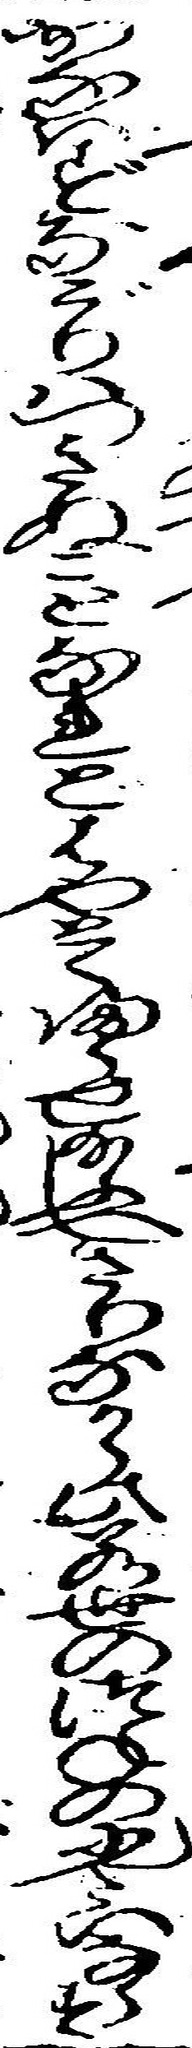かなはずなごりはつきぬことなれどはやとく帰らせ給ふへしさりなから此若世のつねのにんたいならす
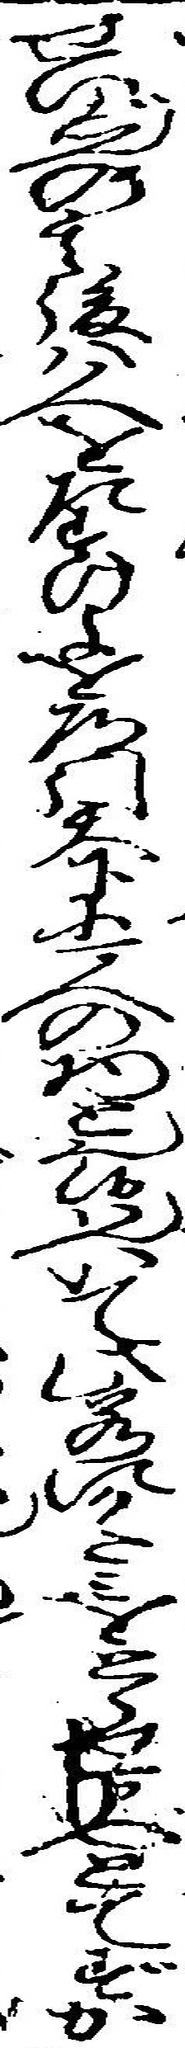せいじんの其後は人をたすけよを道引天下に一人の物と也候はんいて此若ににかたみをとらせ申へしとてずか
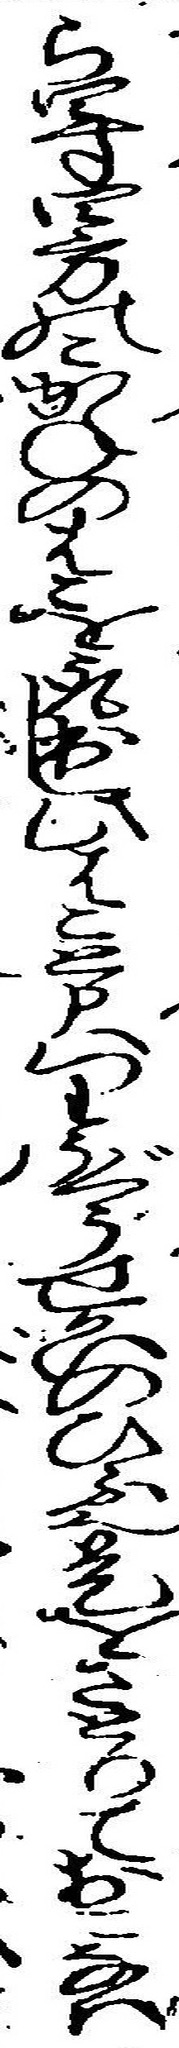ら四寸四方のこかねのはこを取出し此はこと申はりうぐうせかいのひふ也是をさとりておこなは
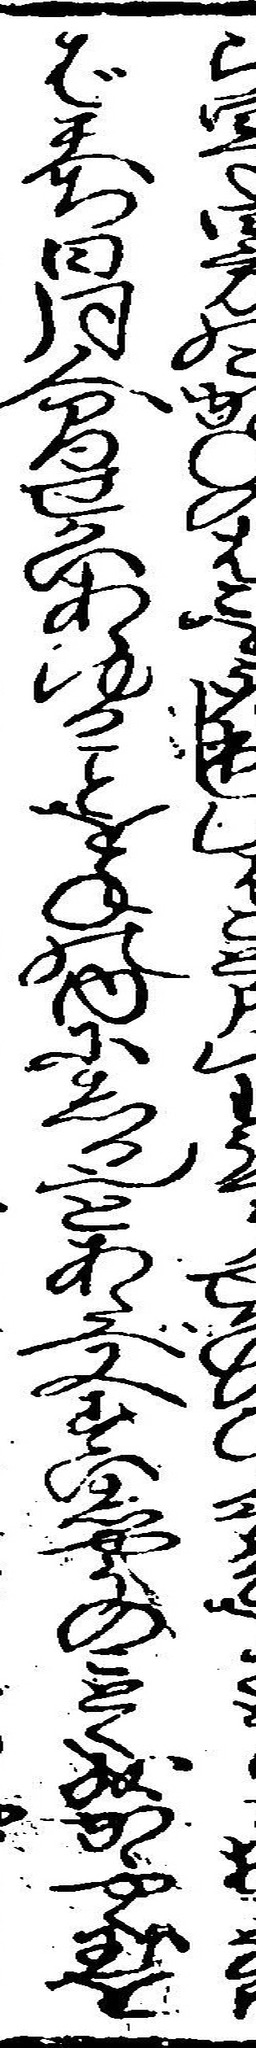ば天ち日月人間せかいあらゆることを手の内にしる也とあたへ又すいしやうのことく成かゝやく玉を
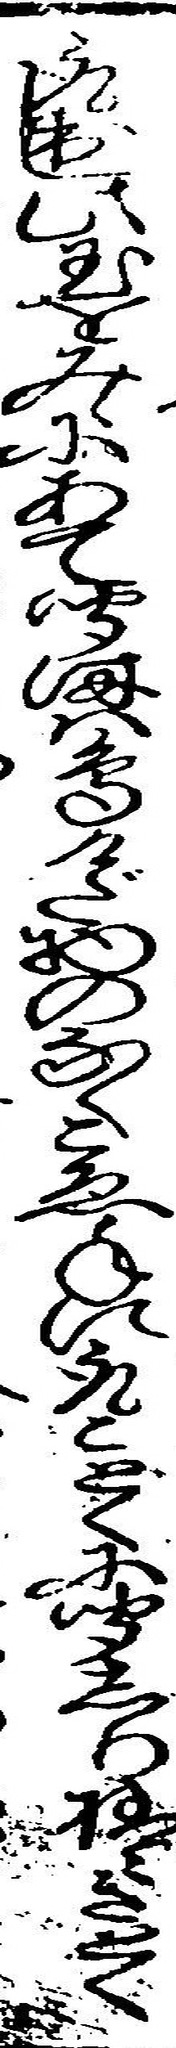取出し此玉をみゝにあて聞時は鳥けだ物のなくこゑ手に取ことくに聞しり様々きとく
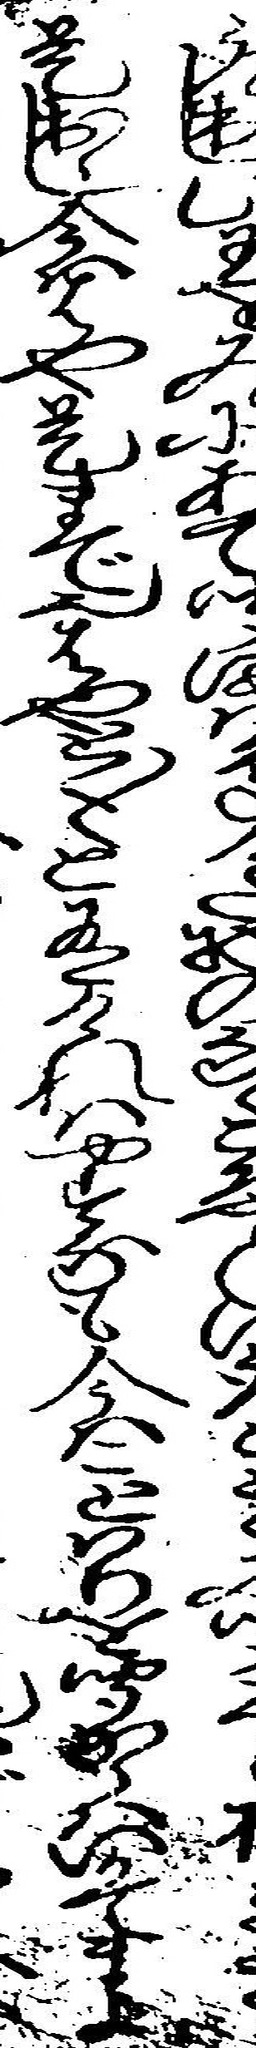是おゝし今ははや是まで也はやとく〳〵と有けれはやすなも今はことはりを聞からはいかてまよ
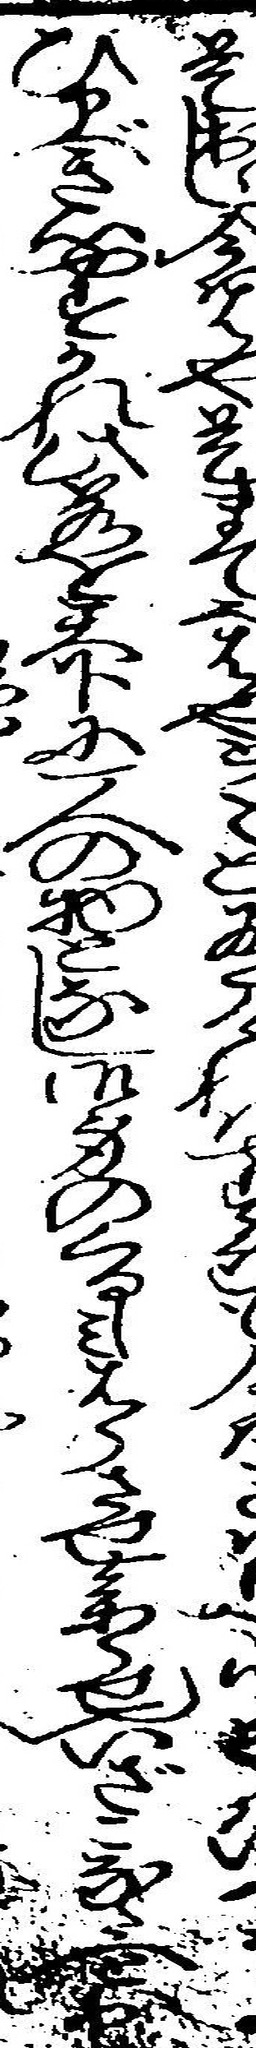ひ申べき心やすかれ此若を天下に一人の物となし御身のくるしみはらさせ参らせんいざこなたへとお
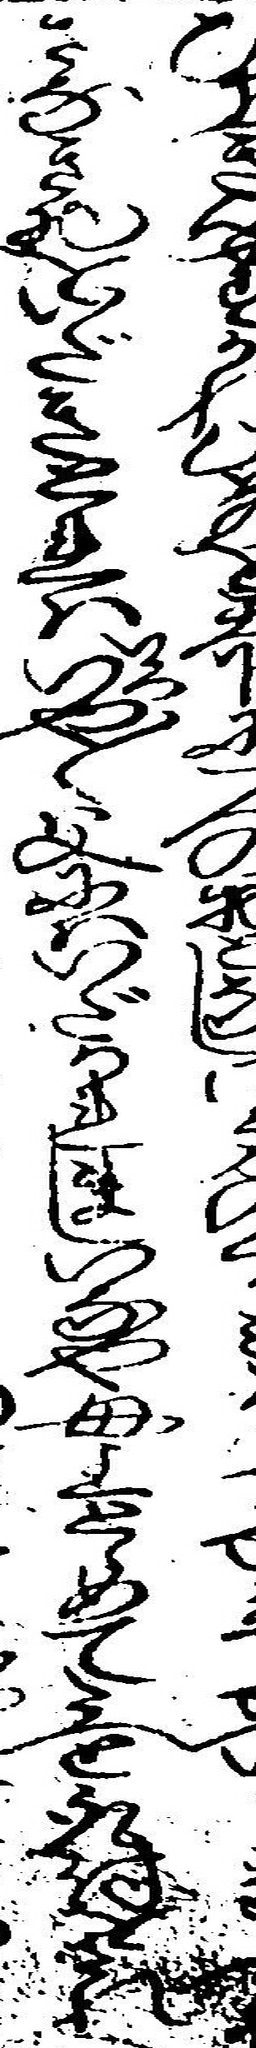さなき物をいだきとれはいろいや〳〵父にはいだかれましいなや母上とゝめてたへと取付をされ
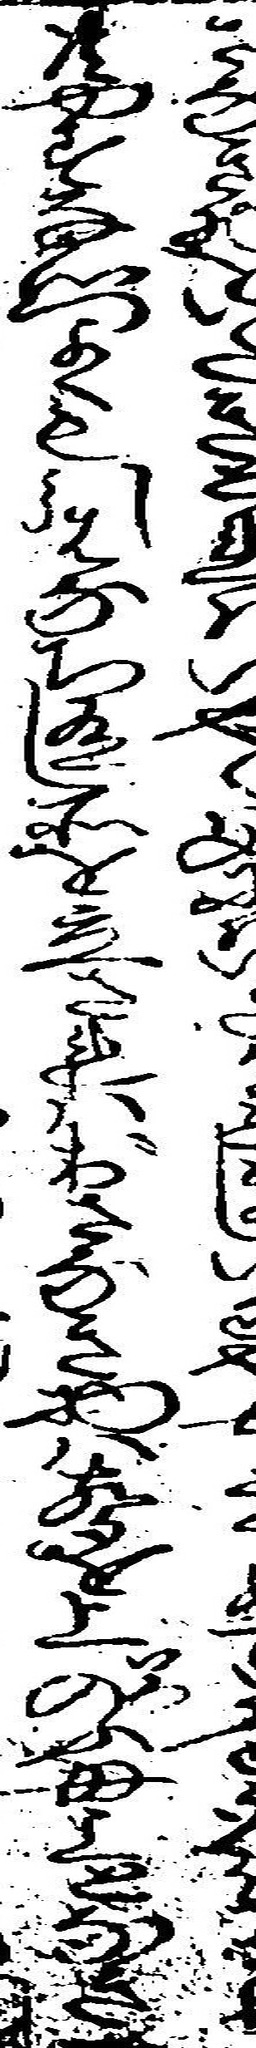共やすな心つよくも引はなち有し所を立されはおさなき物は声を上いろのふ母上となき
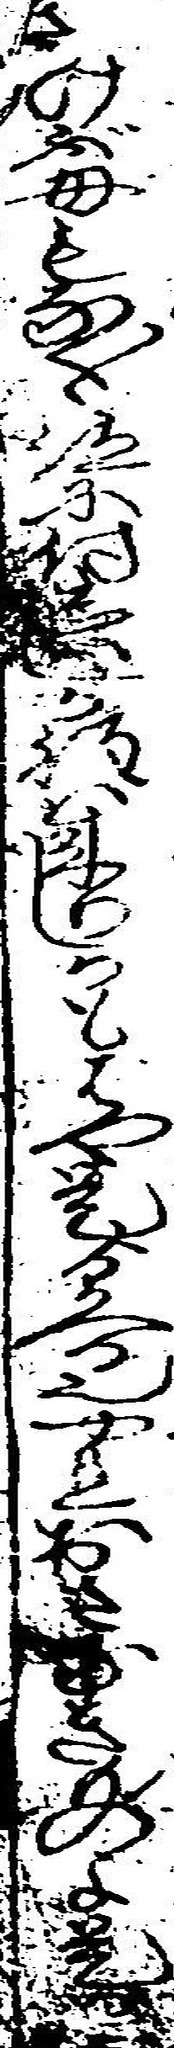さけぶ母もなく〳〵跡に付しはしか程は来りしかもはや是ゟかへる也やれおさなきものよ是かこん

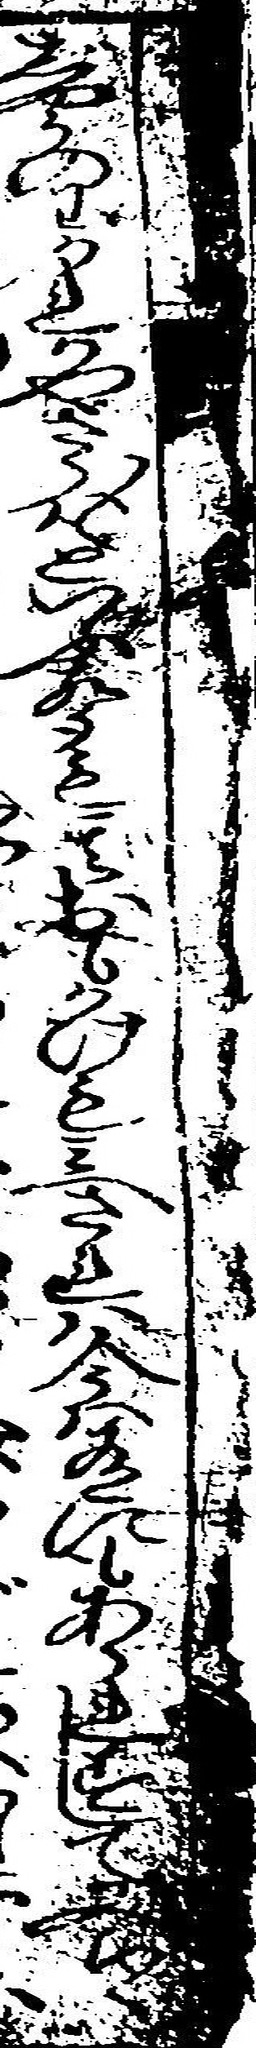じやうのわかれかやさらは〳〵といふ声も其おもかけもみへされは今は有にもあられすして又ちく
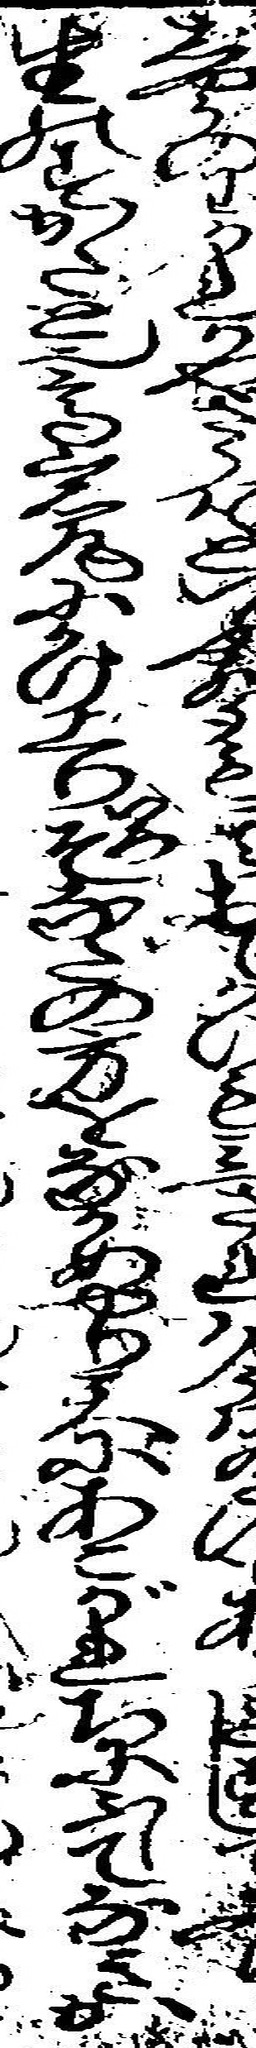生のすかたと也高岩尾にかけ上りいろそなたの方をなかめやり天にあこがれちにふしてなきか
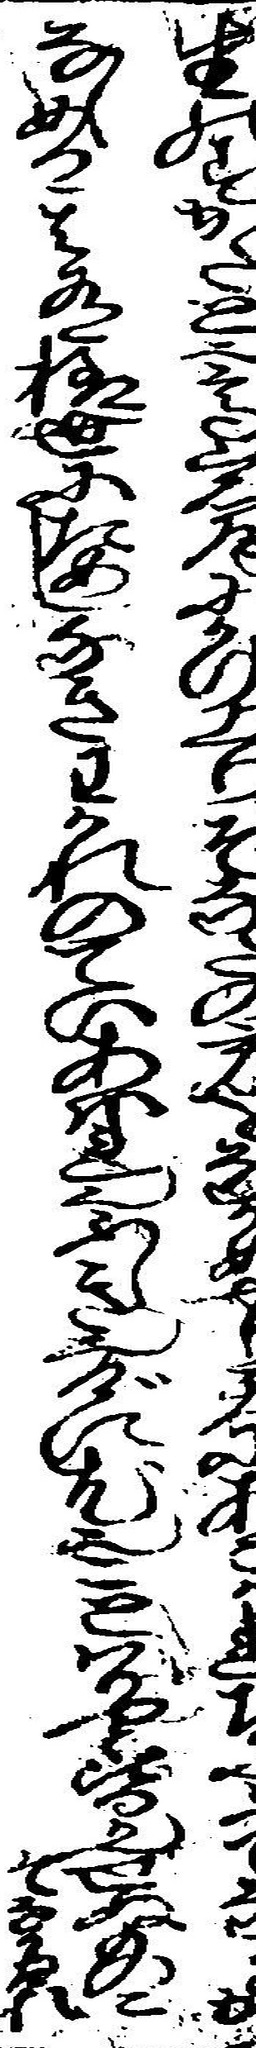なしめる其有様世にためしなきわかれのていあはれ也ふしき也げに尤也ことはりや皆かんせぬものこそなかりけれ
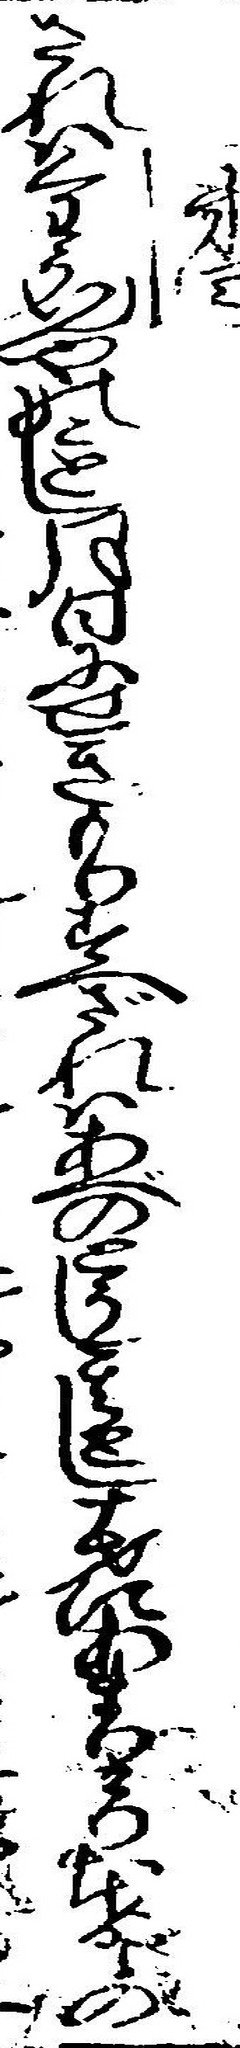されはくわういんやのごおし月日にせきもりすべざれはあべのとうし其とし十才にあまりけり本ゟよの
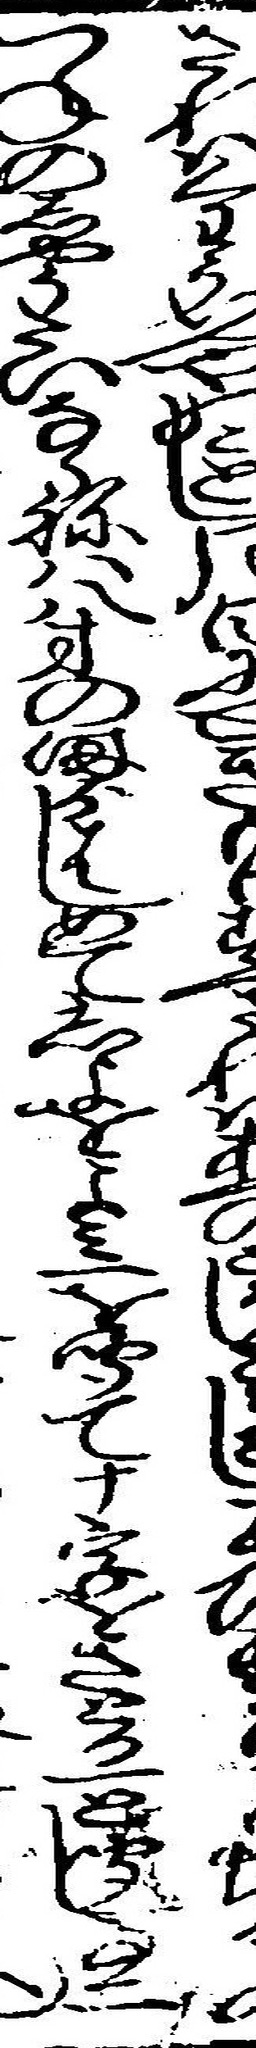つねのしやうたいならねは八才の時よりはしめてしよをよみ一を聞て十字をさとり一と聞し事二
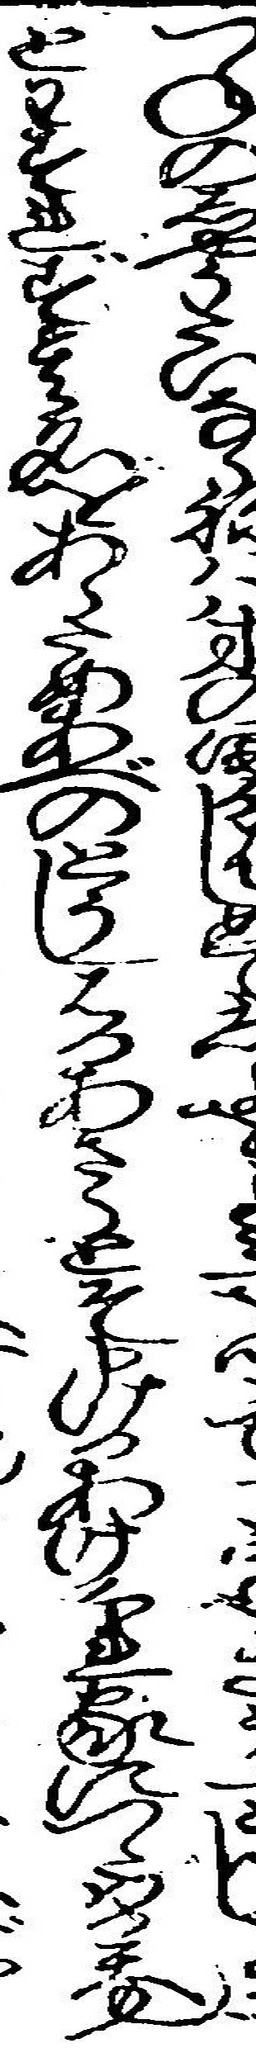とわすれずその名をあらためあべのとうしはるあきらとそ申けるあけくれ家につたはる天もん
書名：[しのだづまつりぎつね付あべの清明出生]
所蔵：東京大学総合図書館 General Library in the University of Tokyo, JAPAN
